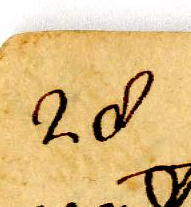28
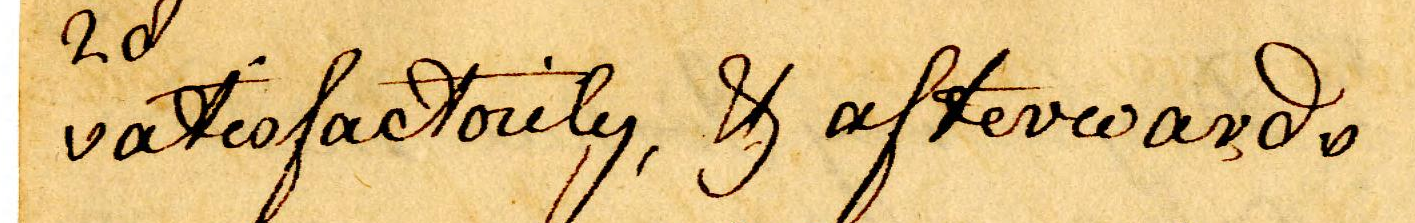satisfactorily, & afterwards
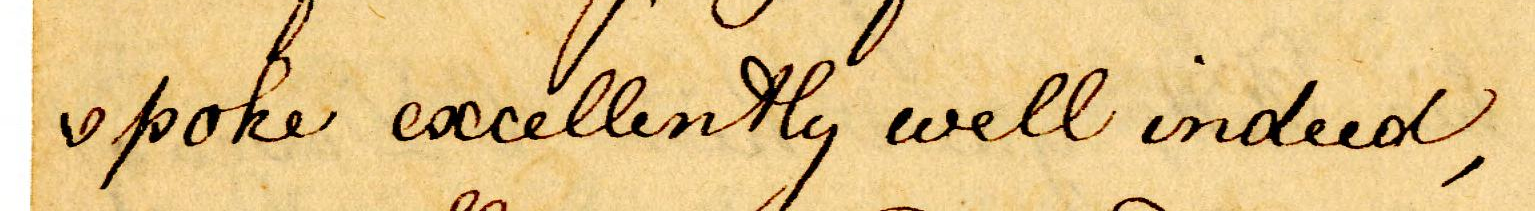spoke excellently well indeed,
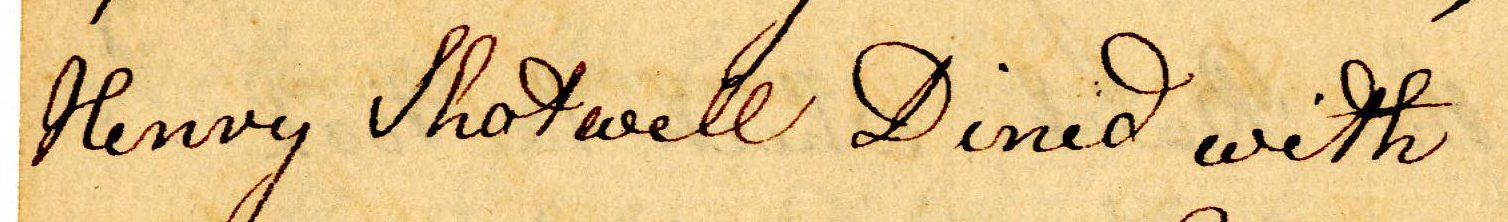Henry Shotwell Dined with
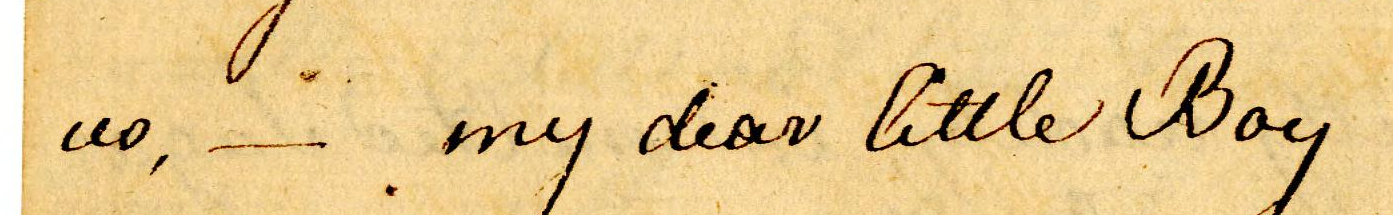us,- my dear little Boy
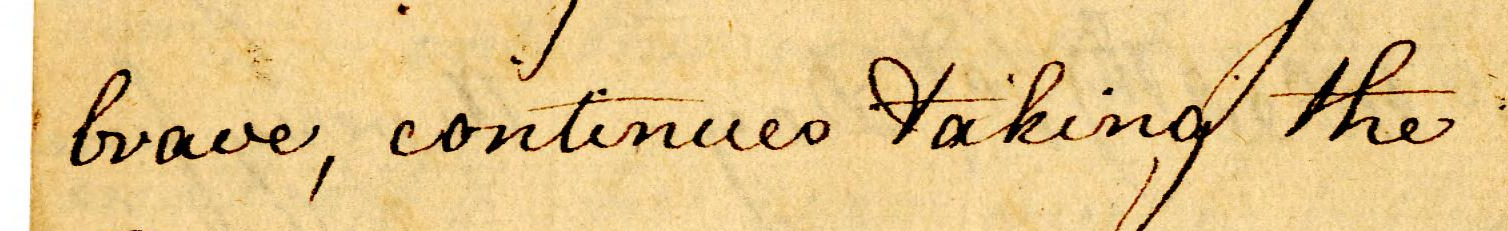brave, continues taking the
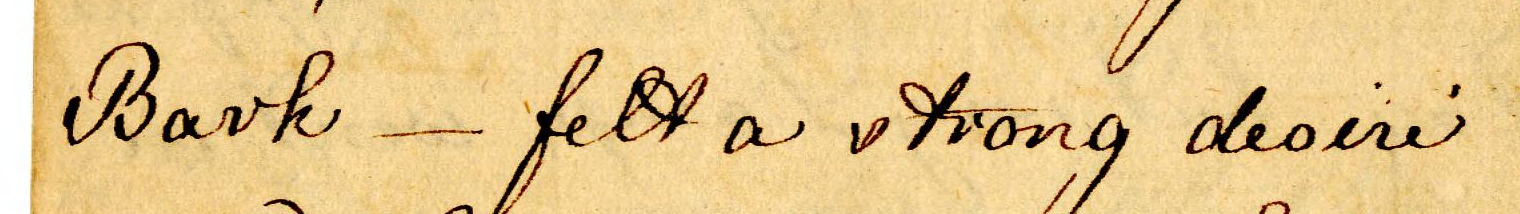Bark- felt a strong desire
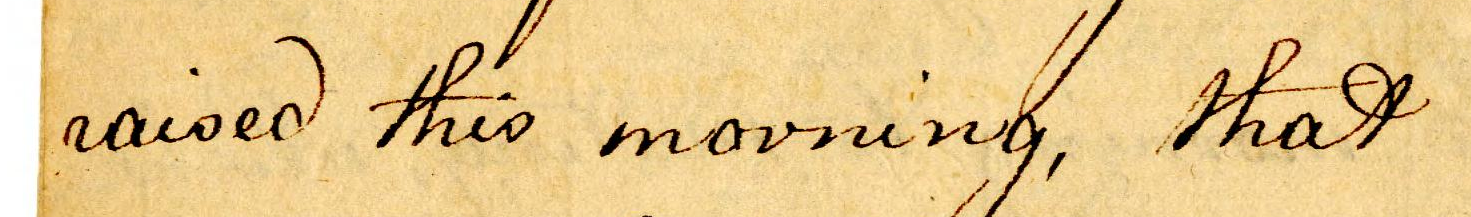raised this morning, that
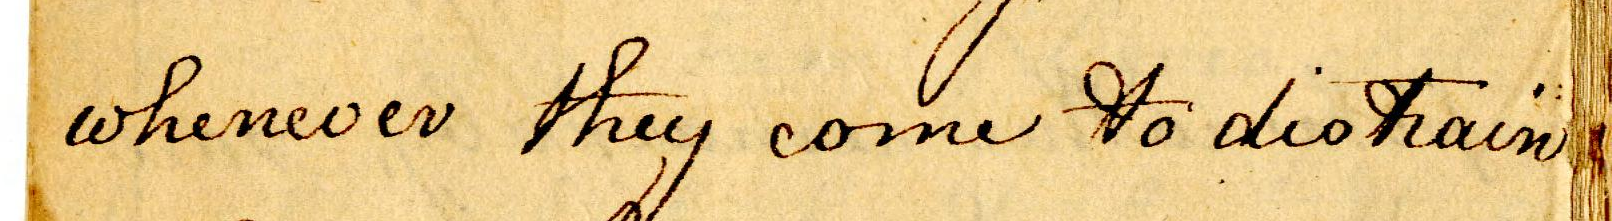whenever they come to distrain
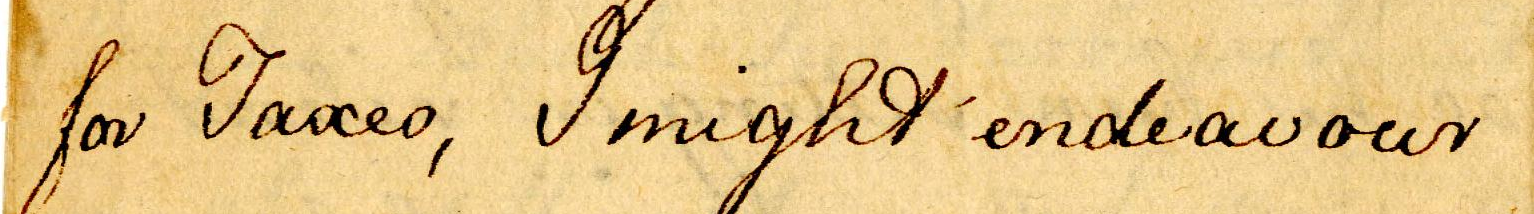for Taxes, I might endeavour
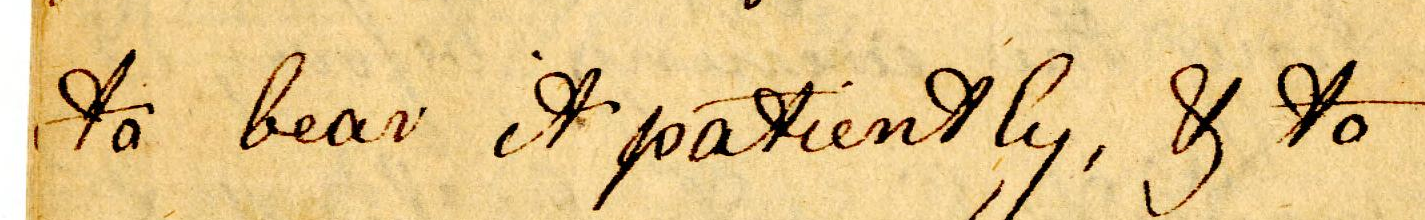to bear it patiently, & to
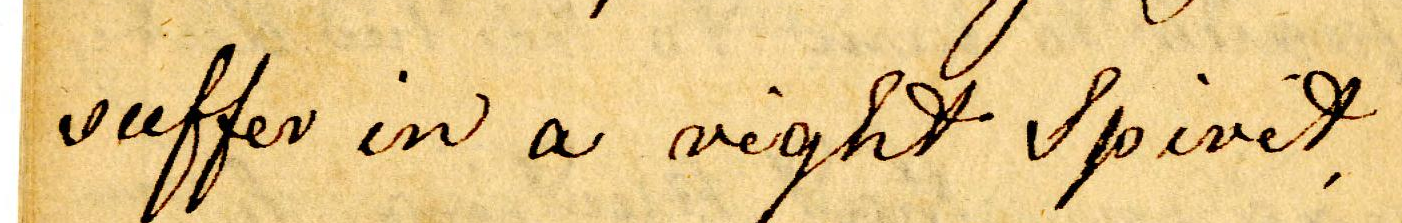suffer in a right Spirit,
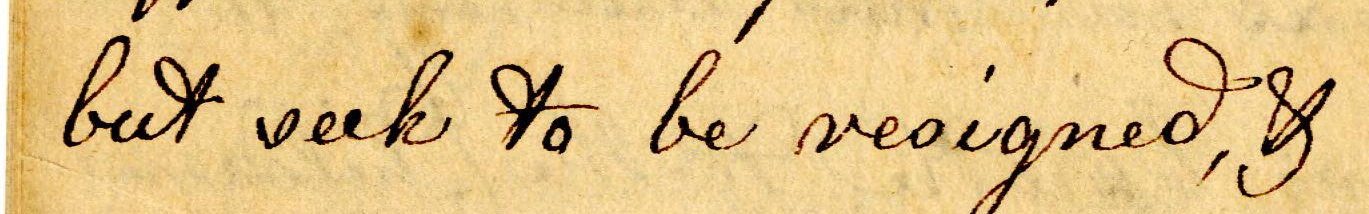but seek to be resigned, &
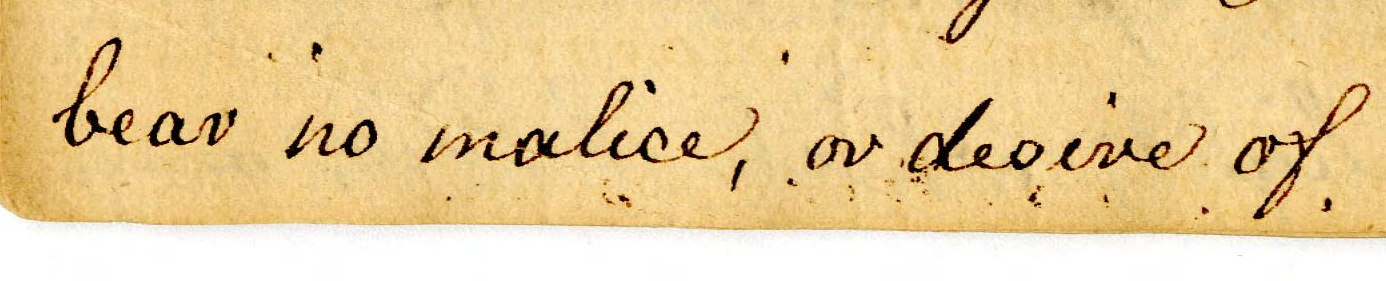bear no malice, or desire of.
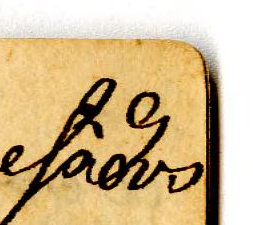29
